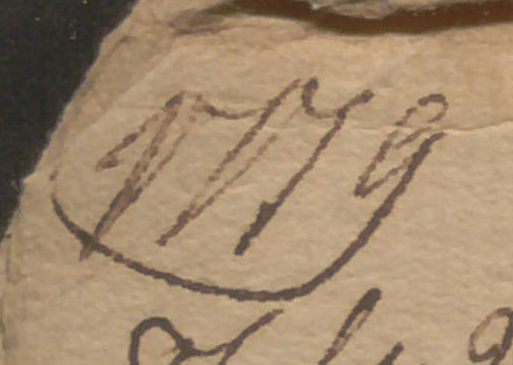1779
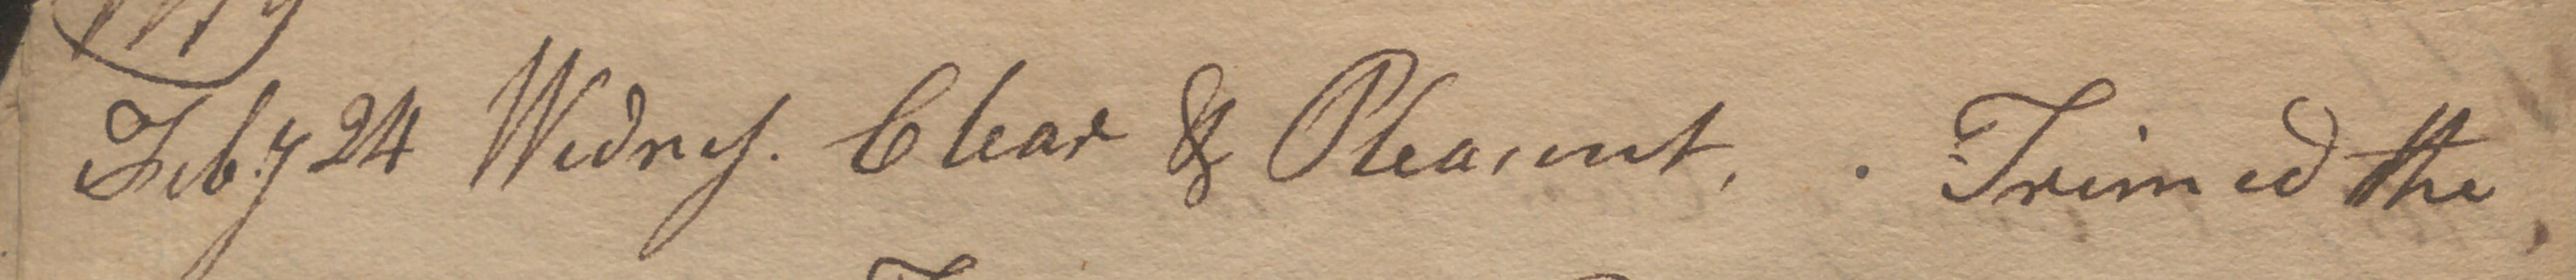Feb^y. 24 Wednes. Clear & Pleasent. Trimed the
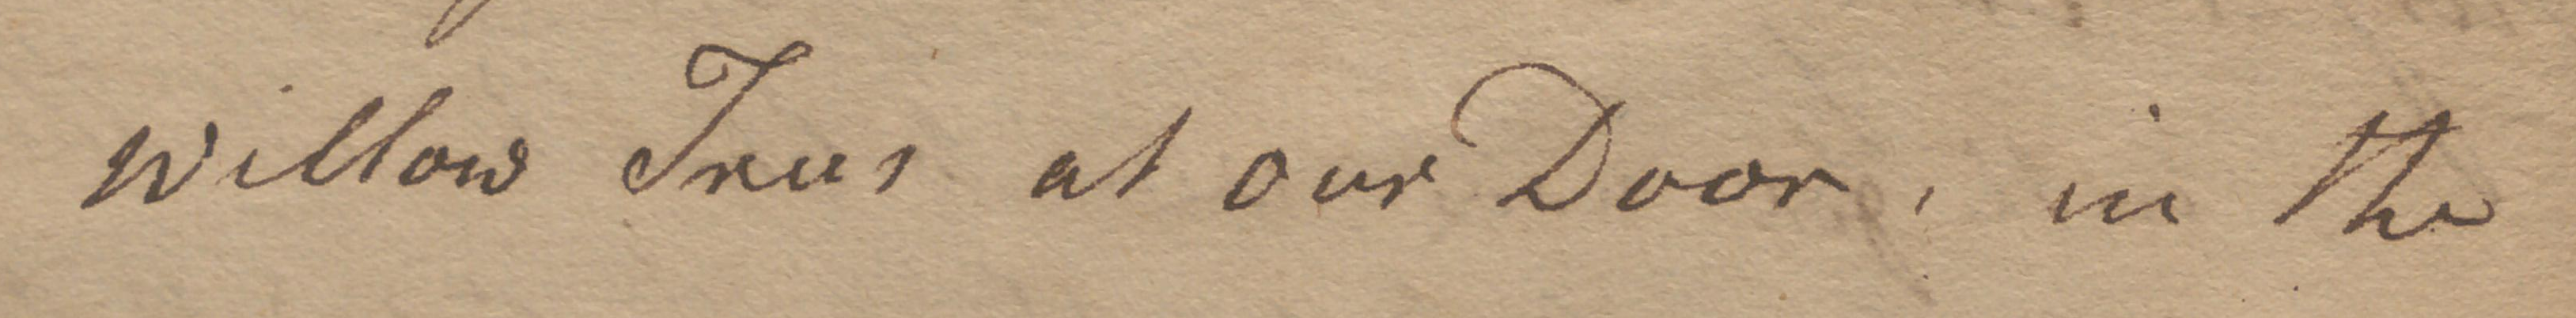Willow Trees at our Door, in the
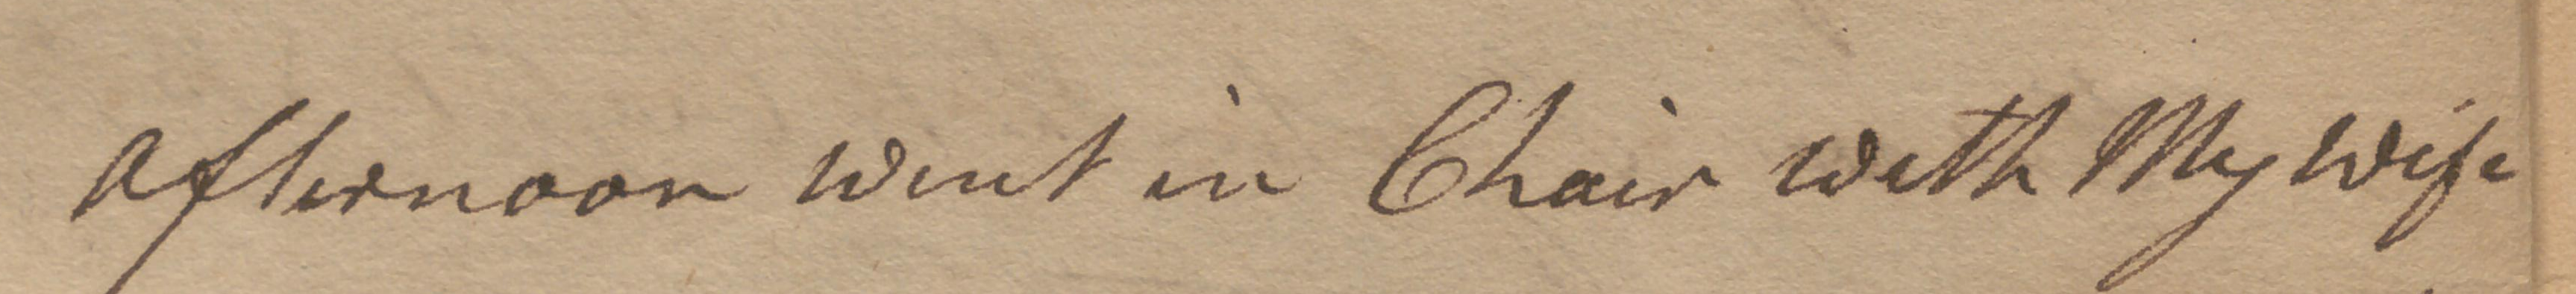afternoon went in Chair with My wife
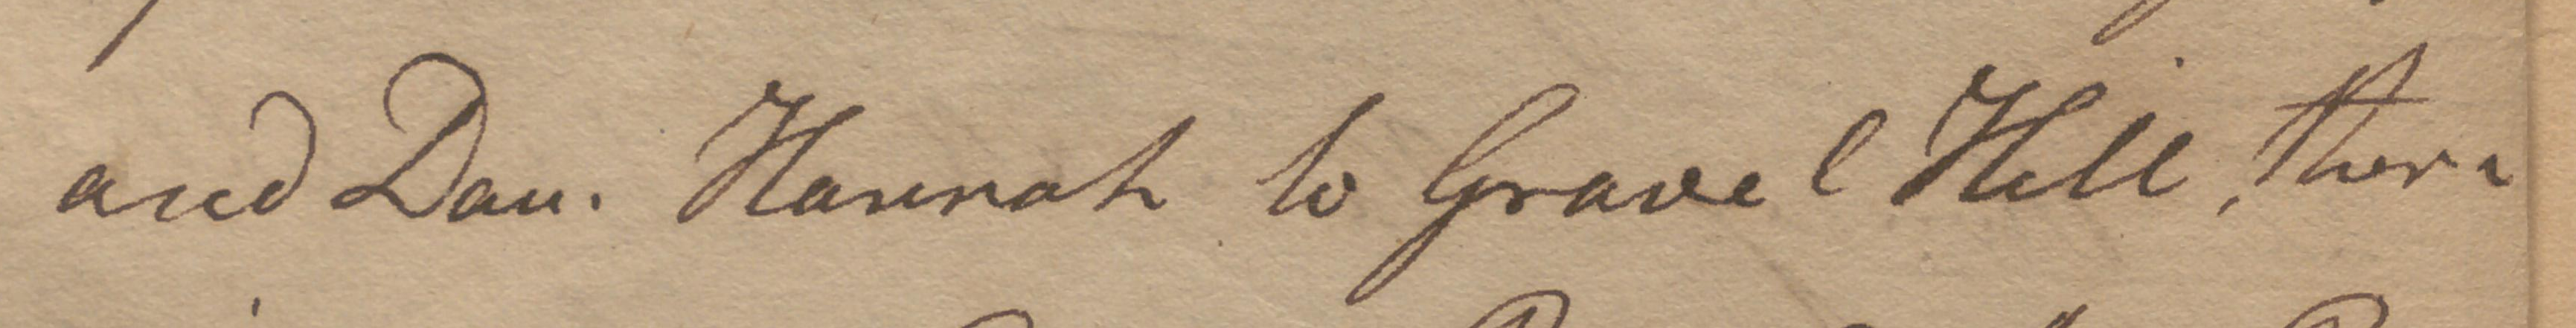and Dan. Hannah to Gravel Hill there
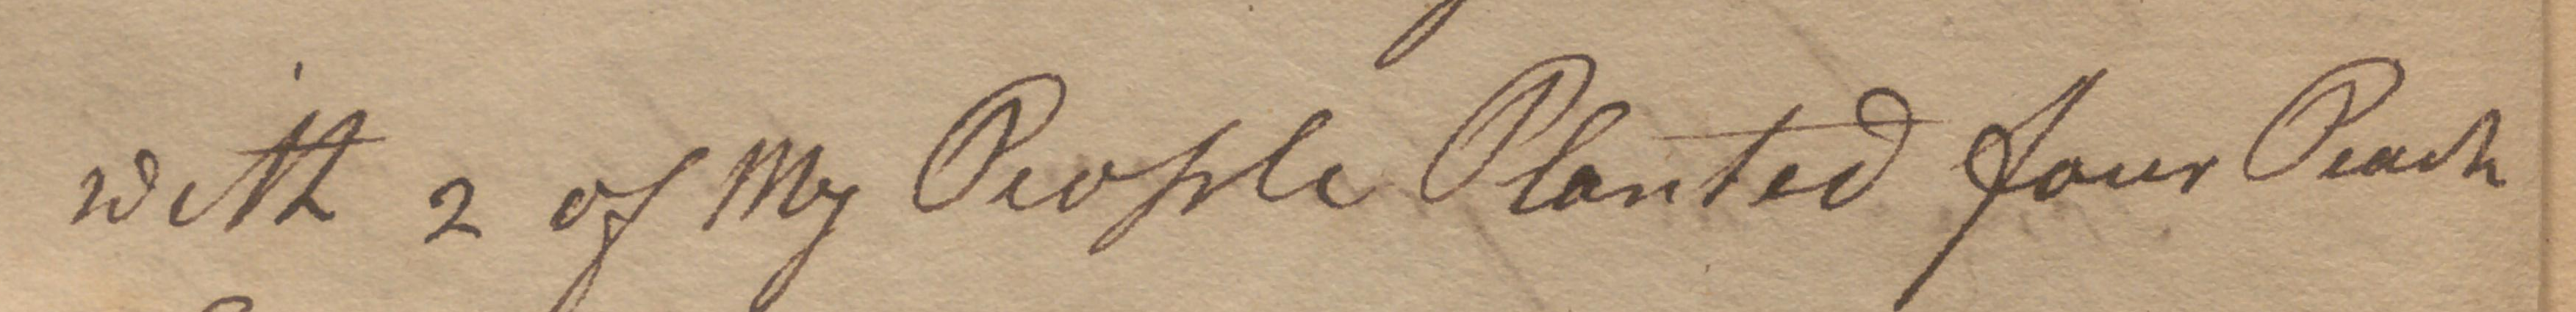with 2 of My People Planted four Peach
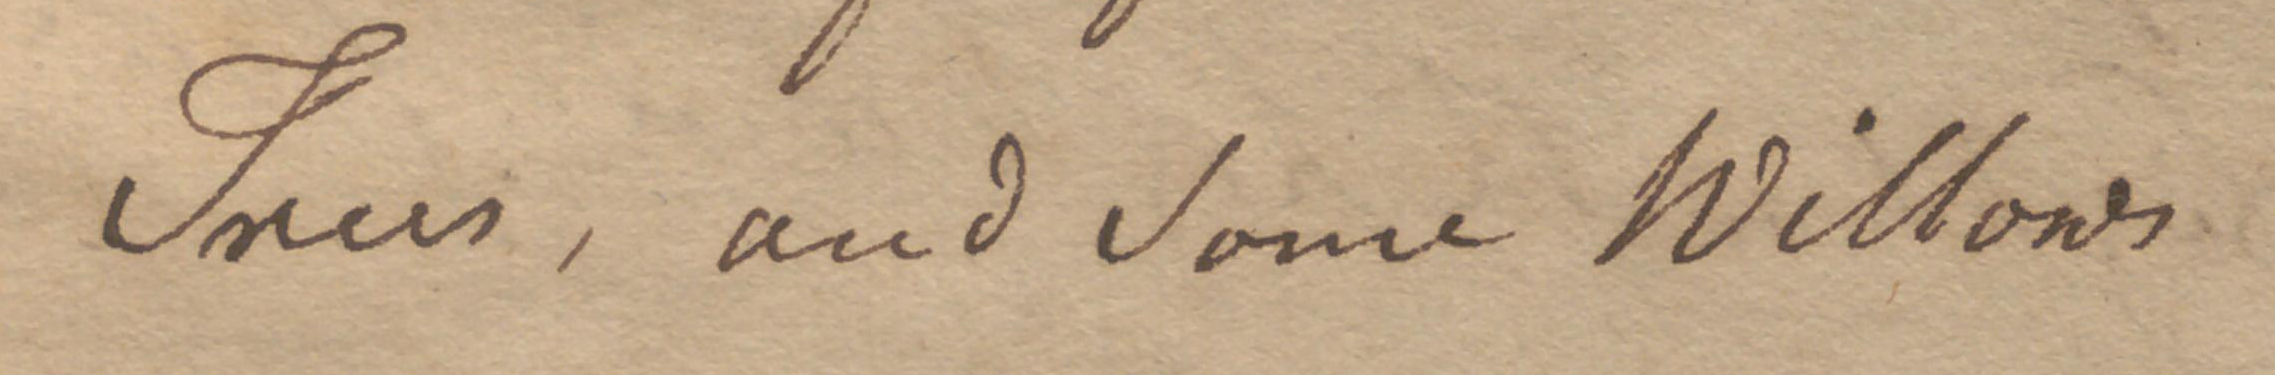Trees, and some Willows
